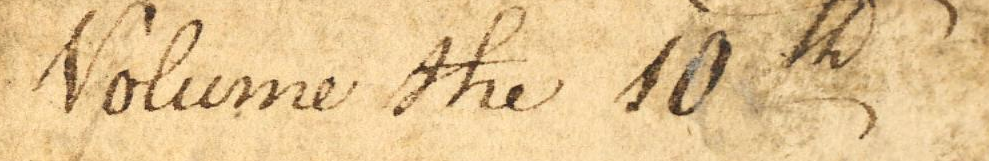Volume the 10^th
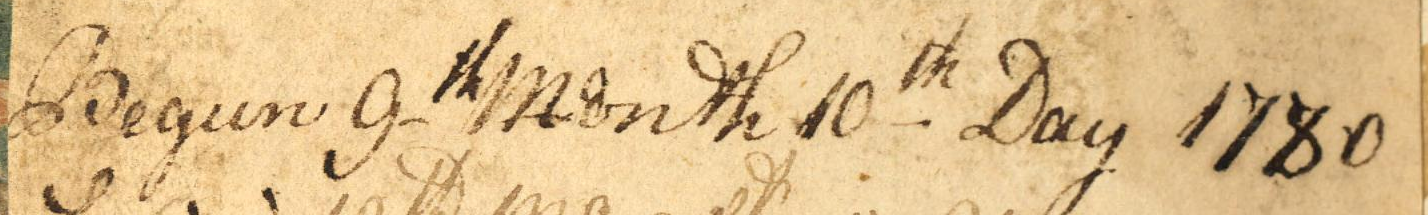Began 9^th Month 10^th Day 1780
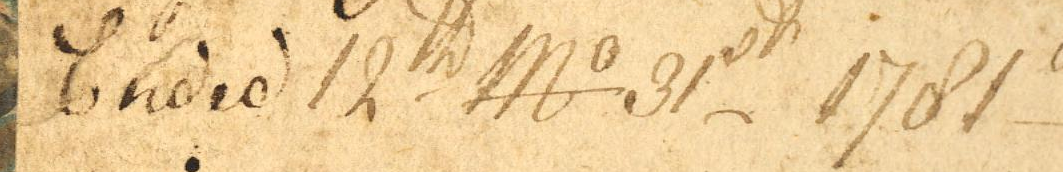Ended 12^th M^o 31^st 1781
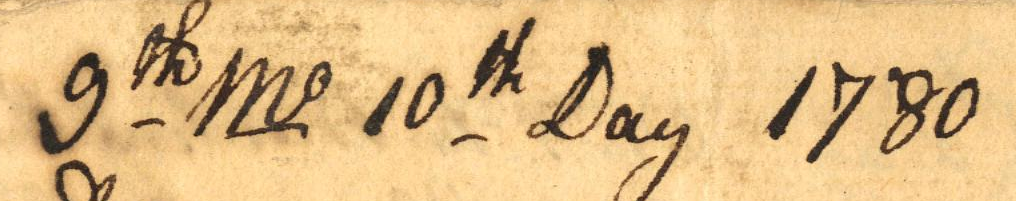9^th M^o 10^th Day 1780
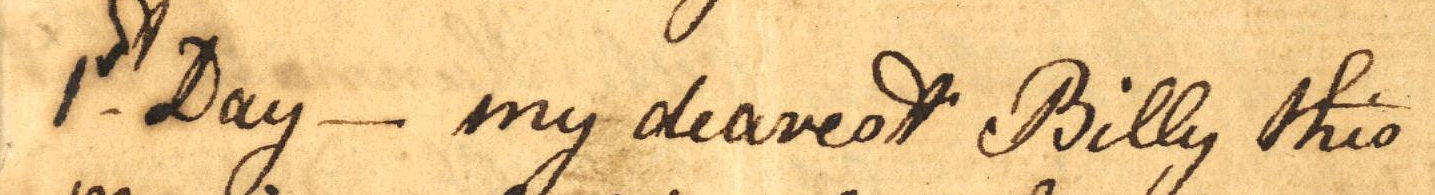1^st Day- my dearest Billy this
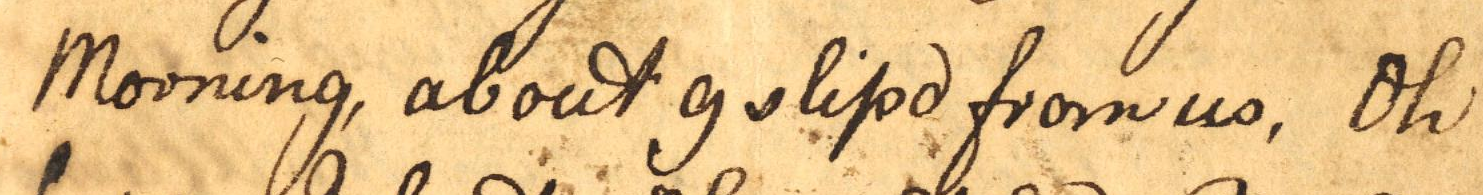Morning, about 9 slipd from us, Oh
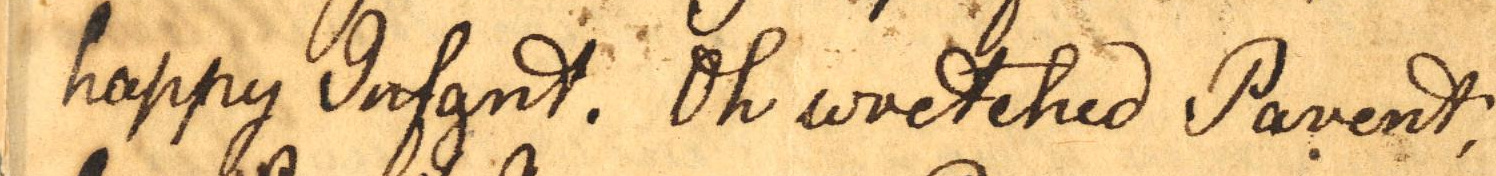happy Infant. Oh wretched Parent,
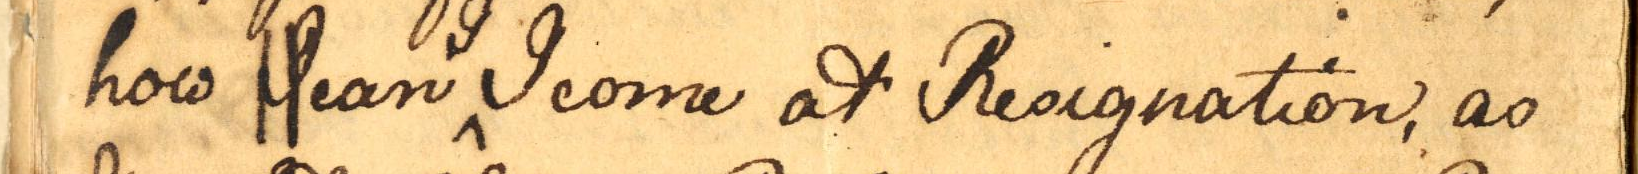how [I] can ^ I come at Resignation, as
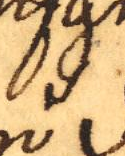I
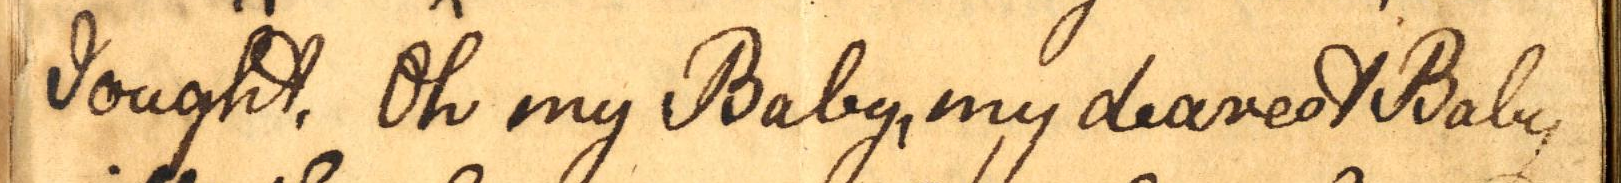I ought, Oh my Baby, my dearest Baby
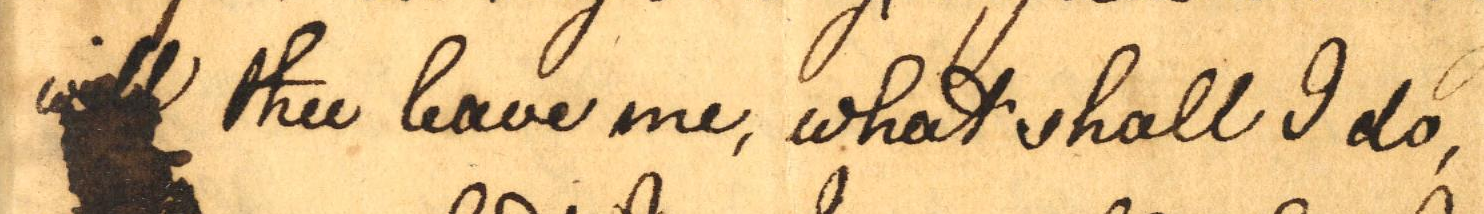will thee leave me, what shall I do,
